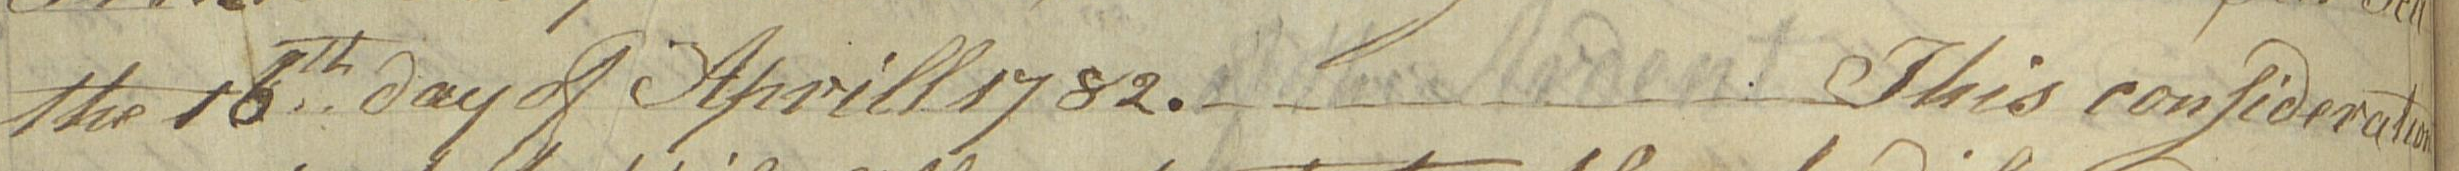to 16^th. day of Aprill 1782. of the Ardent This consideration
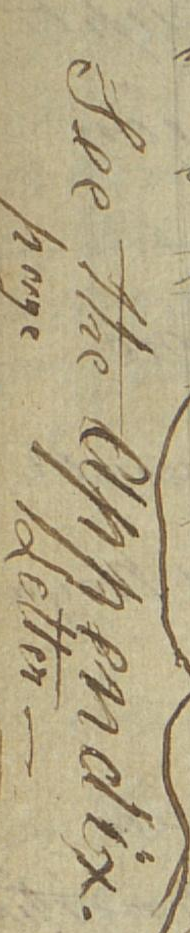See the Appendix.
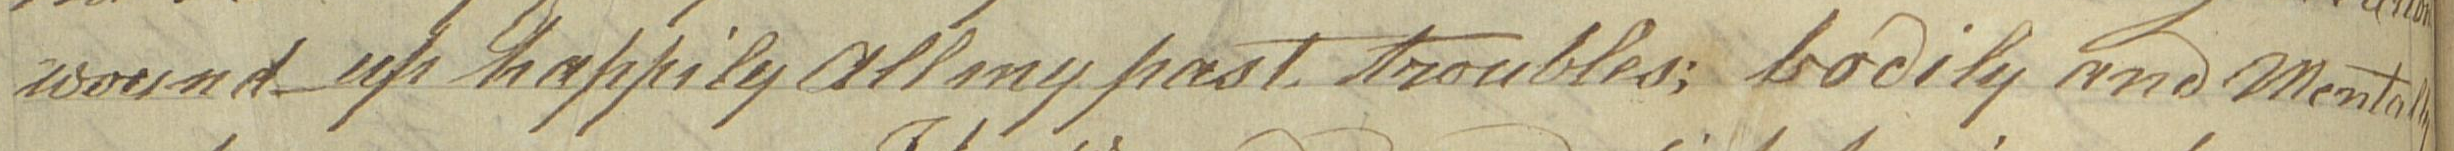wound up happily All my past troubles; bodily and Mentally
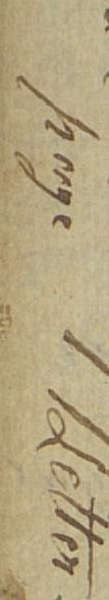poge Letter
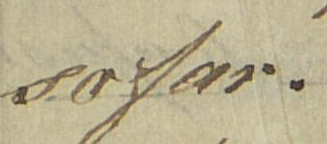so far.
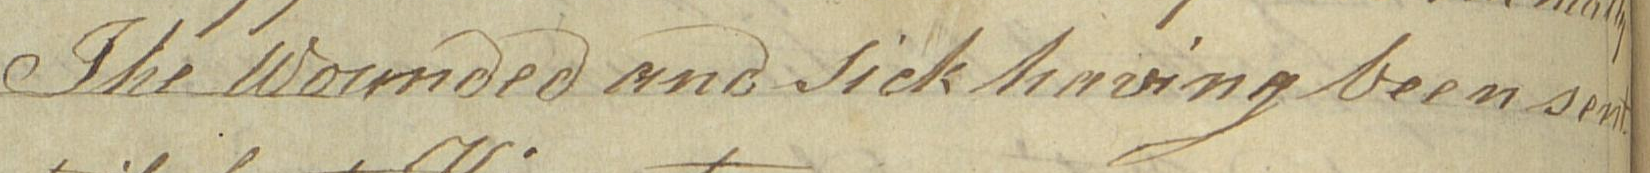The Wounded and sick having been sent
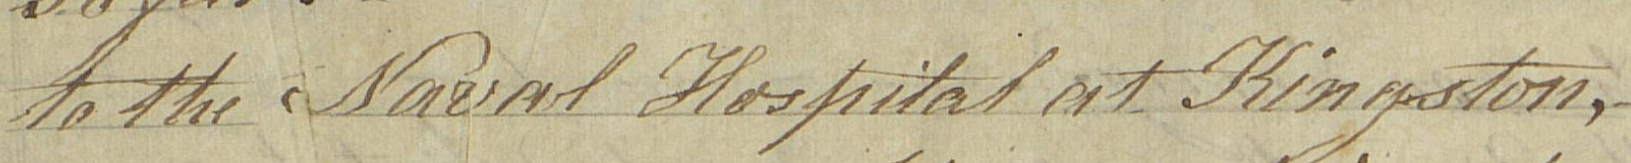to the Naval Hospital at Kingston,
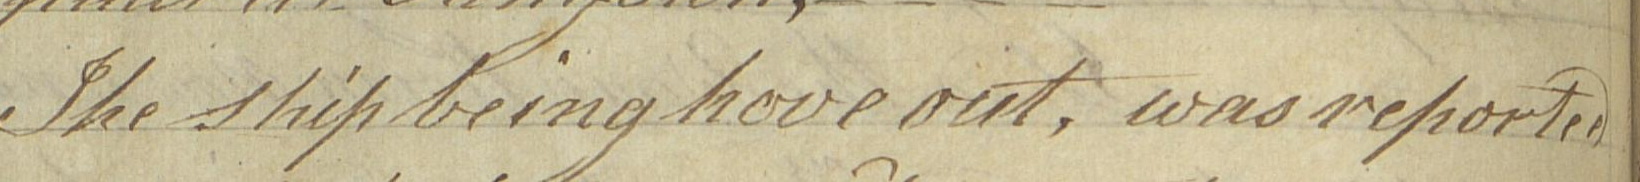The ship being hove out, was reported
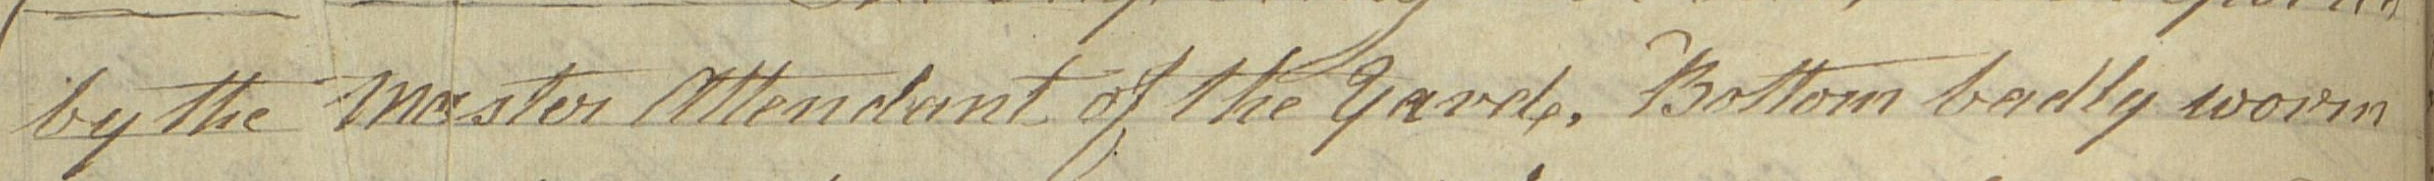by the master Attendant of the Yard. Bottom badly worn
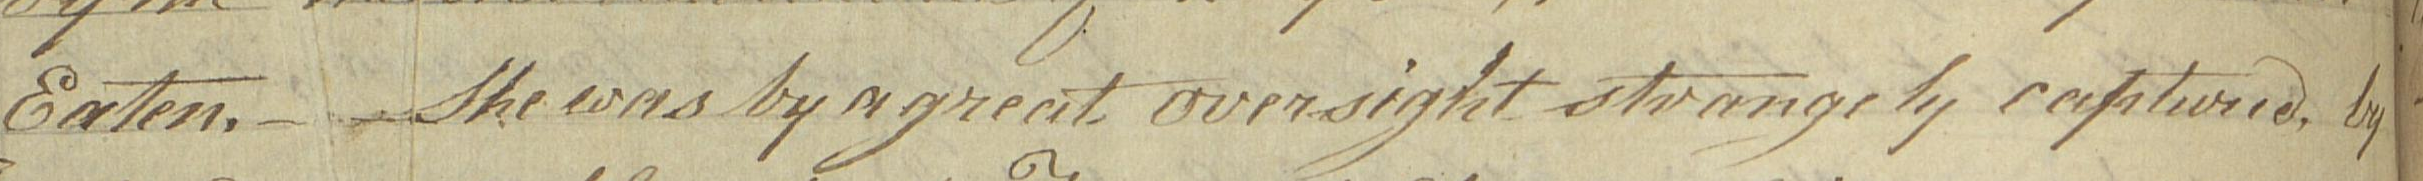Eaten. She was by a great oversight strangely captured by
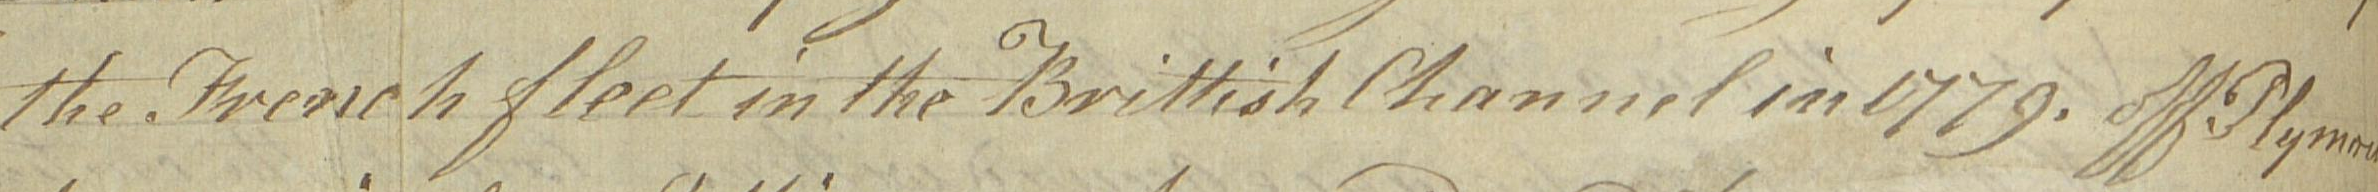the French fleet in the Brittish Channel in 1779. off Plymouth
